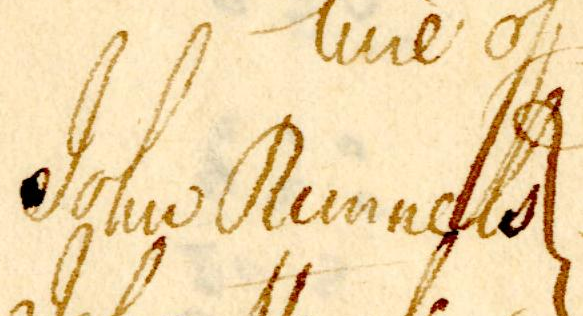John Rannels
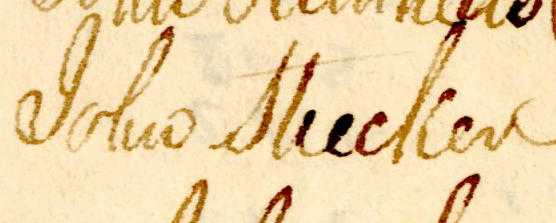Jalue Sleecker
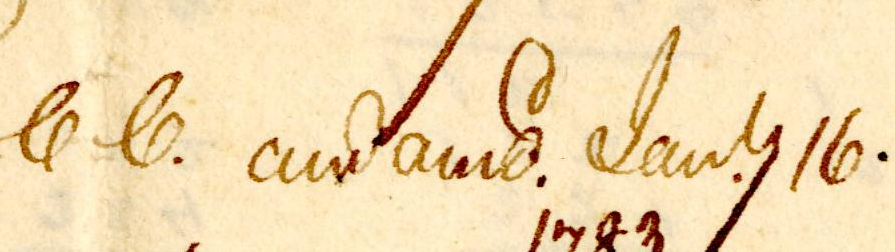C C. ccur and^d Jan^y. 16
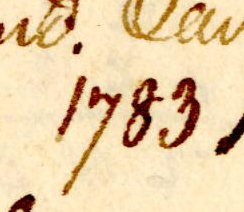1783
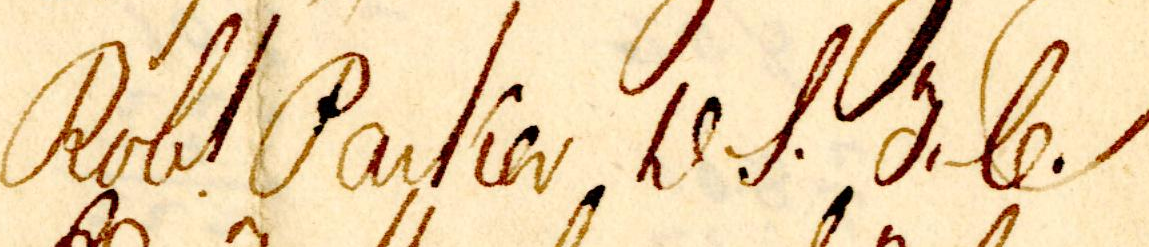Rob^t. Parker & S. J. C.
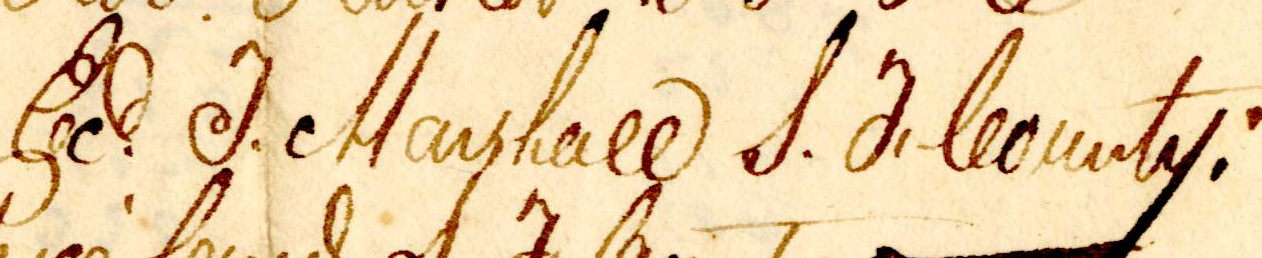Ec^d. J Marshall S J. County:
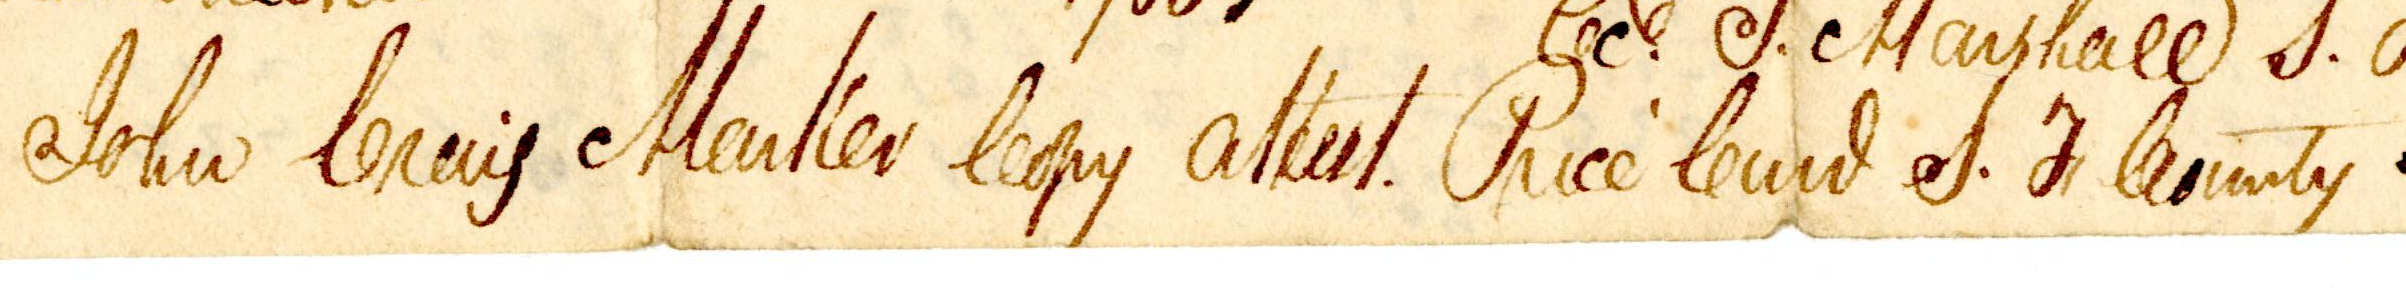John Craig Henker Coppy attest. Price Curr^l S. F County
